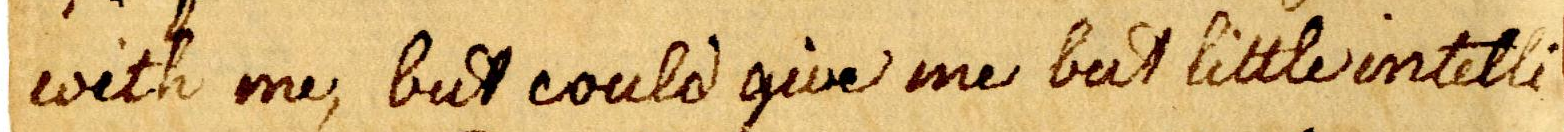with me, but could give me but little intelli
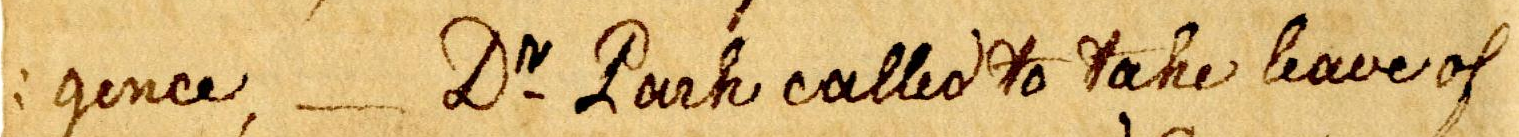-gence- D^r. Park called to take leave of
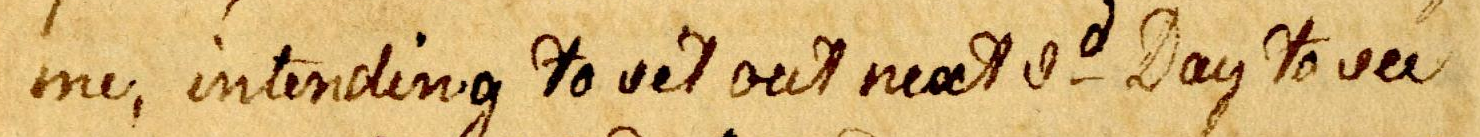me, intending to set out next 3^d. Day to see
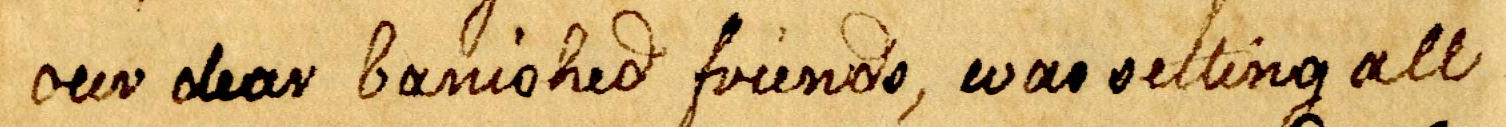our dear banished friends, was setting all
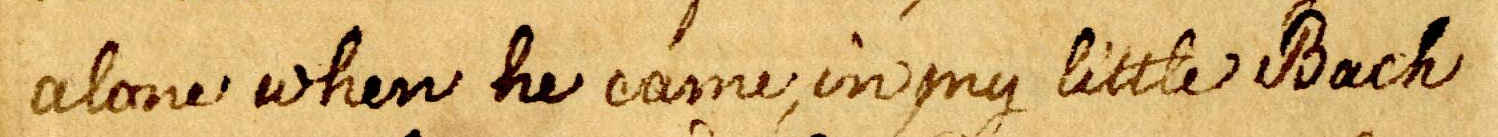alone when he came, in my little Back
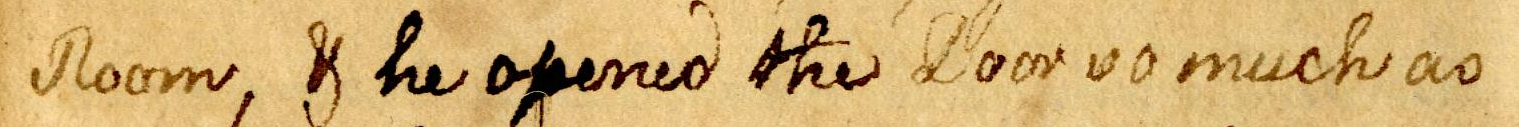Room, & he opened the Door so much as
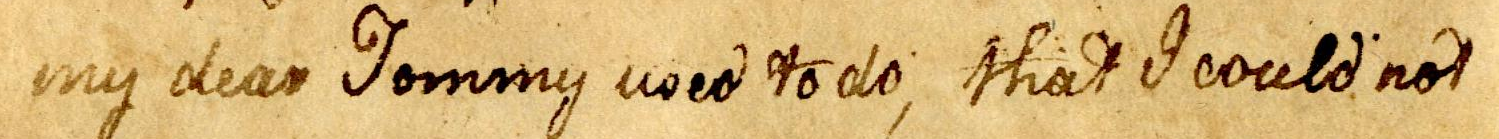my dear Tommy used to do, that I could not
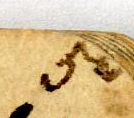5
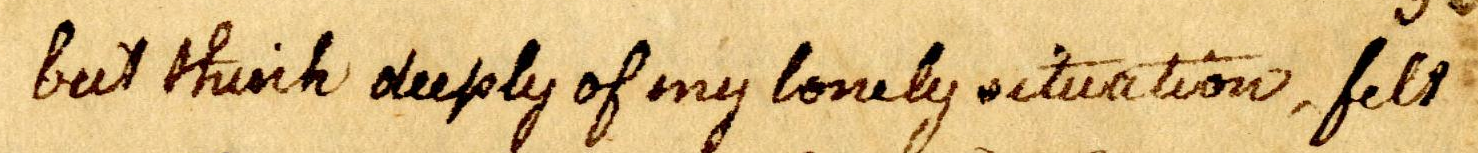but think deeply of my lonely situation, felt
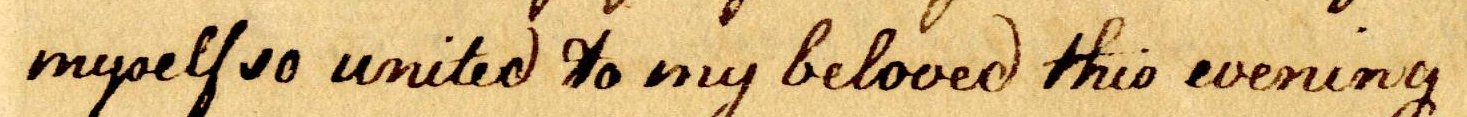myself so united to my beloved this evening
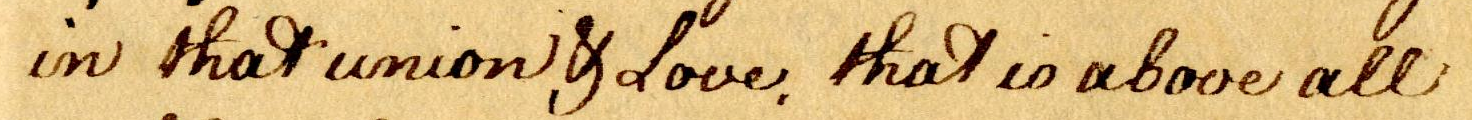in that union & Love, that is above all
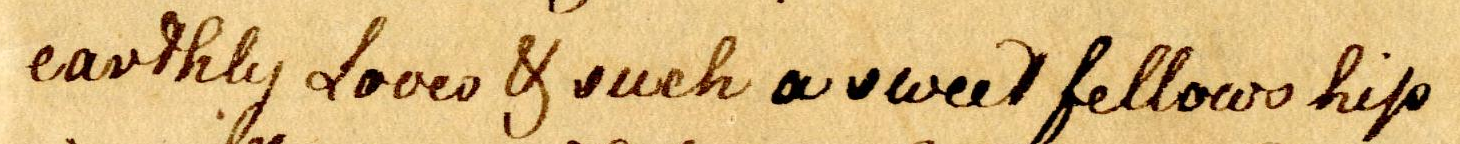earthly Loves & such a sweet fellows hip
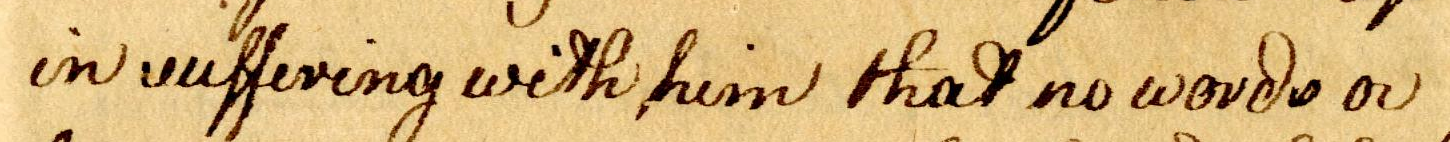in suffering with him that no words or
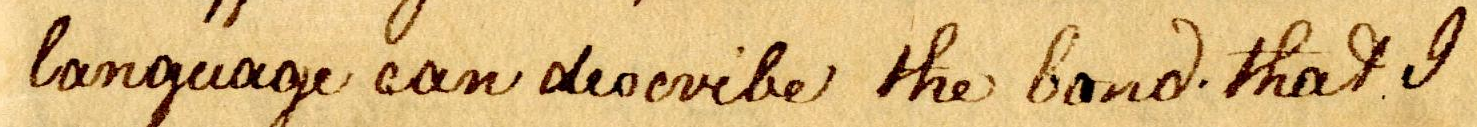language can describe the bond that I
